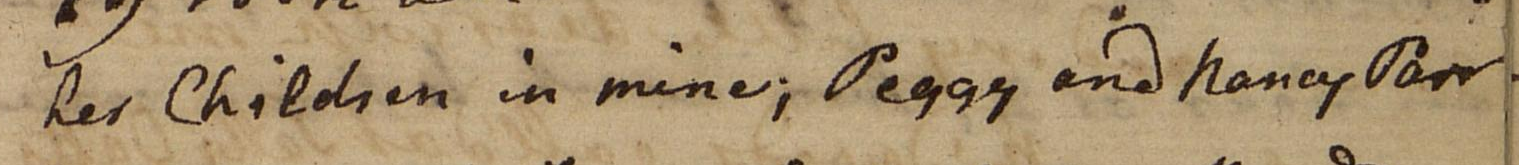her Children in mine; Peggy and Nancy Parr
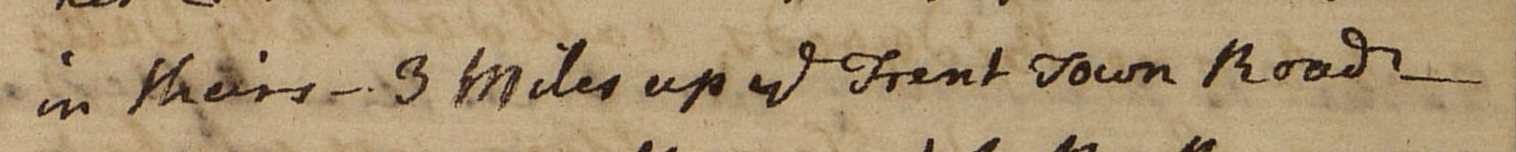in theirs- 3 Miles up y^e Trent Town Road-
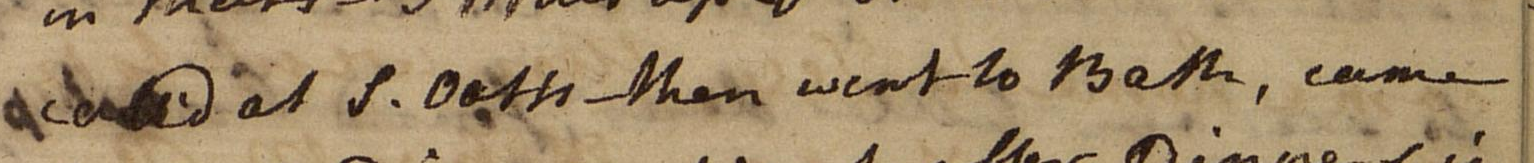call'd at S. Oatts- then went to Bath, came
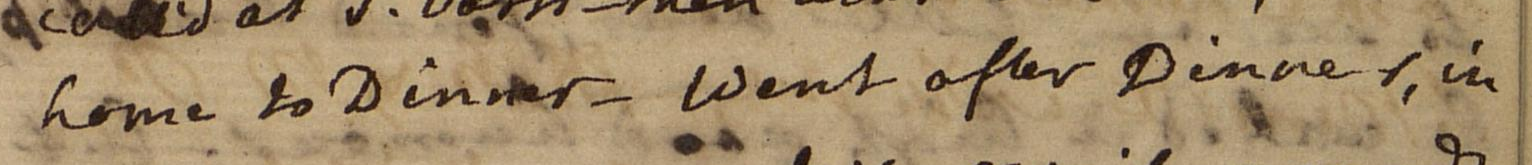home to Dinner - went after Dinner, in
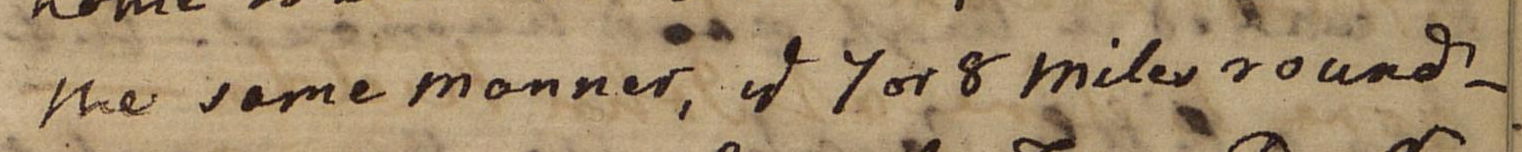the same manner, y^e 7 or 8 miles round-
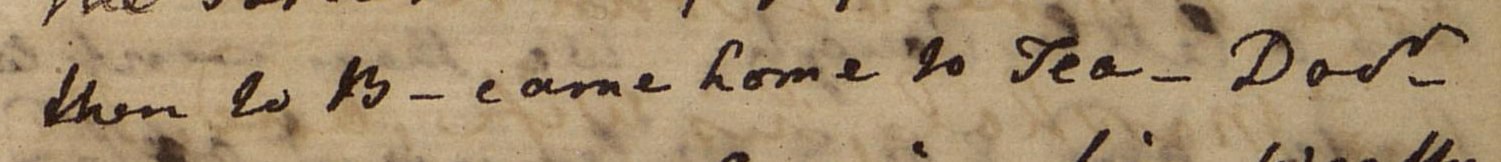then to B- came home to Tea- Doc^r.
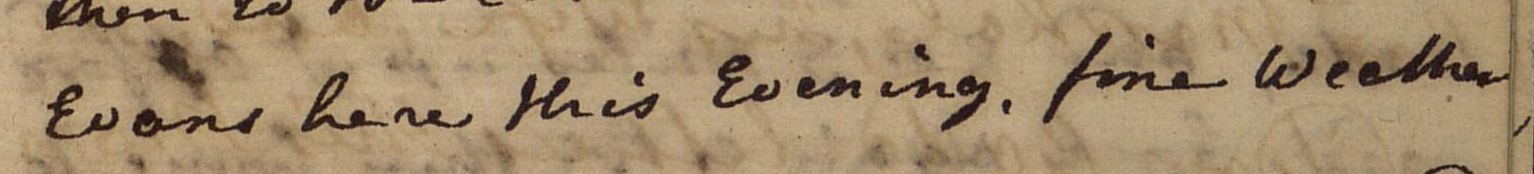Evans here this Evening, fine weather
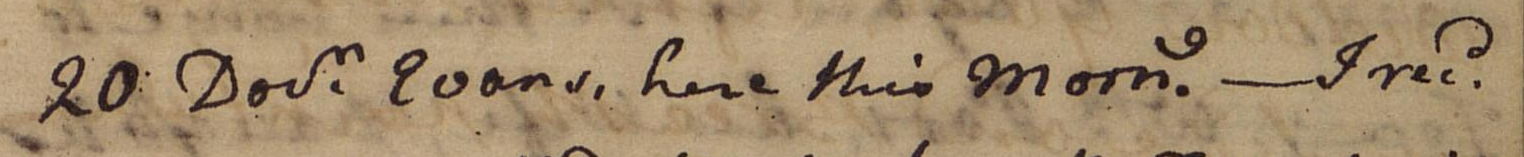20 Doc^r. Evans, here this morn^g.- I rec^d.
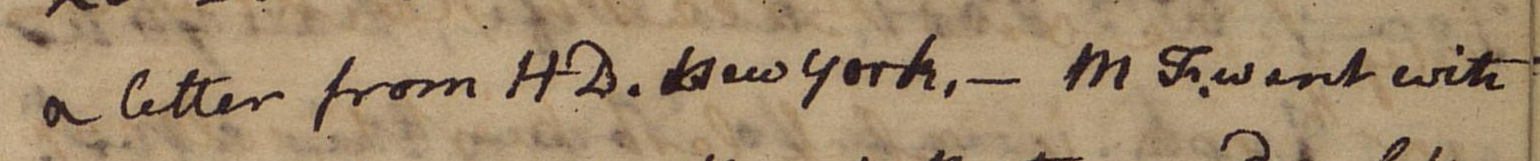a letter from HD. New York.- M F went with
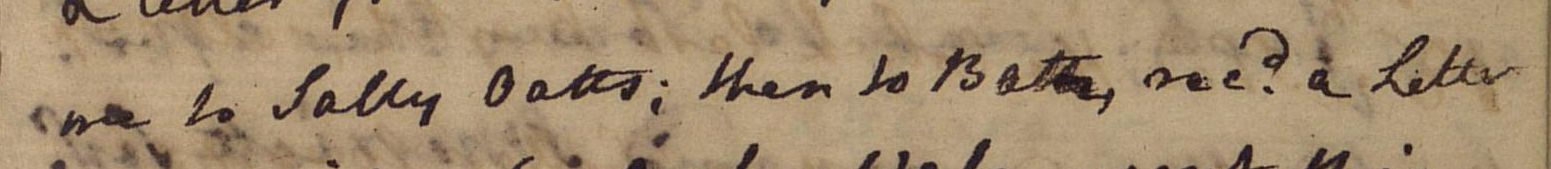me to Sally Oatts; then to Bath, rec^d. a Letter
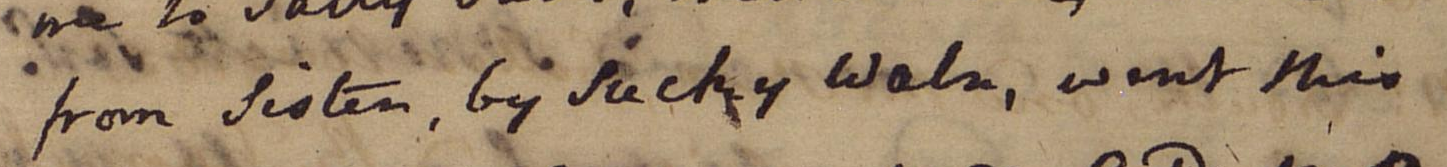from Sister, by Sueky Waln, went this
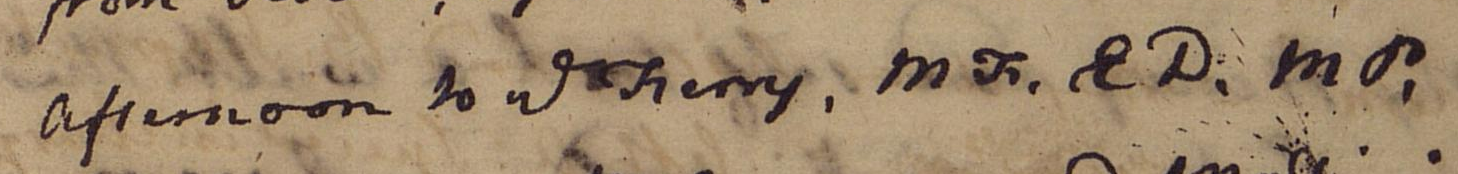Afternoon to y^e Ferry, MF. ED. MP.
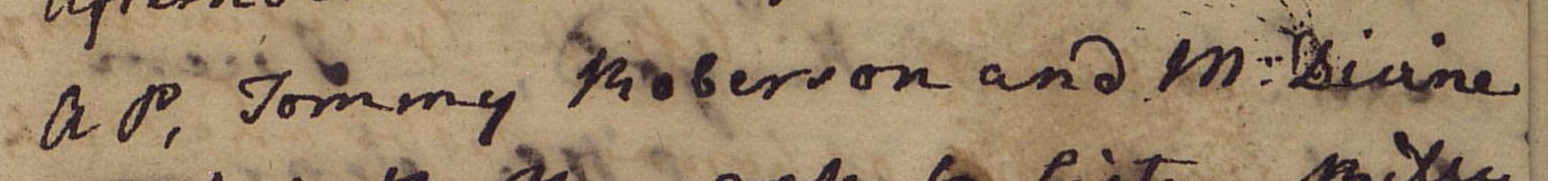A P, Tommy Roberson and M. Divine
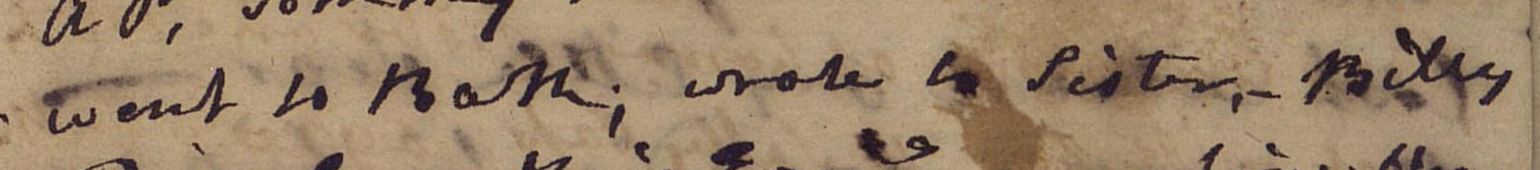went to Bath, wrote to Sister,- Billy
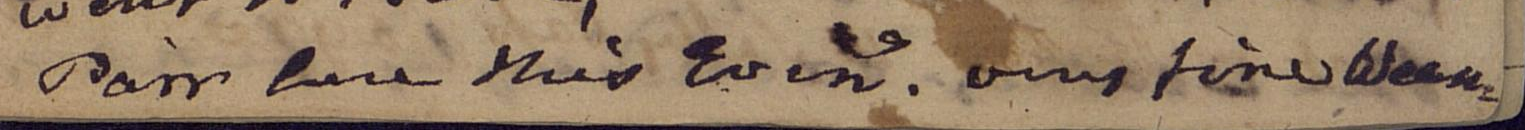Parr here this Even^g. very fine weather
